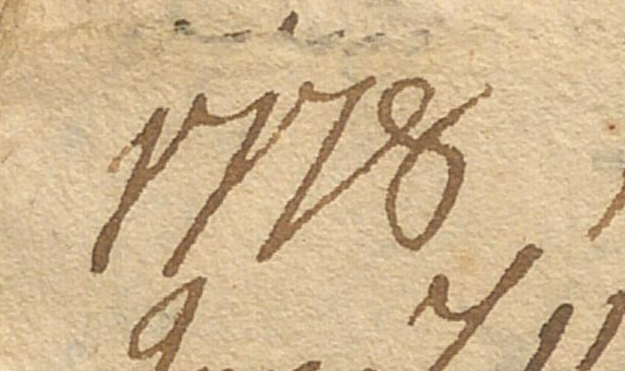1778
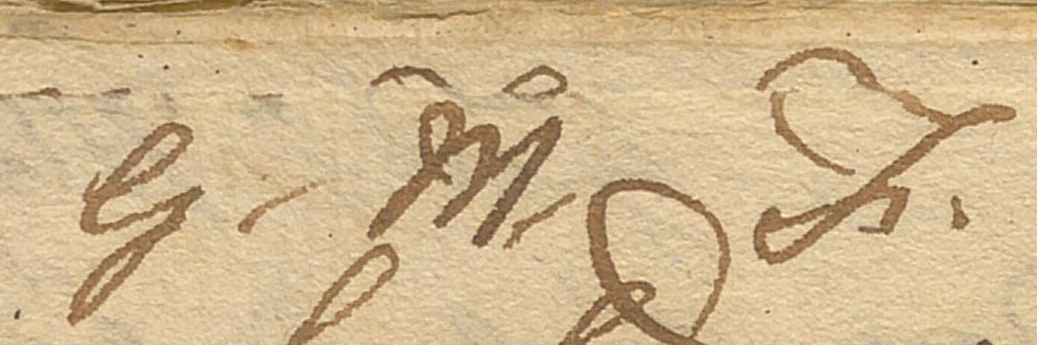G.M. F.
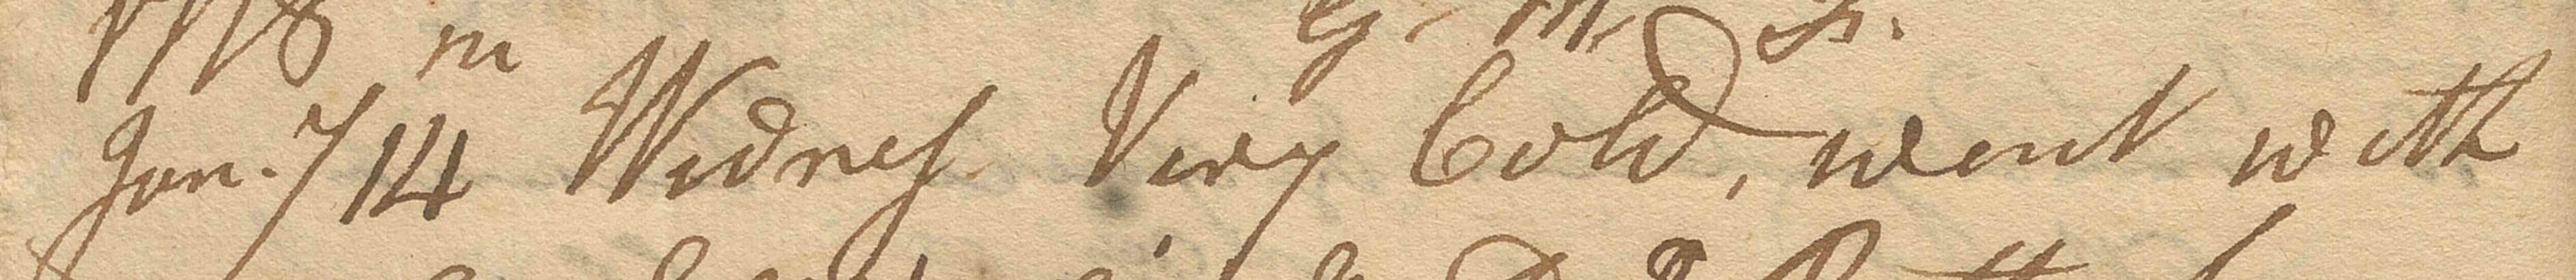Jan^y 14^th Wednes Very Cold, went with
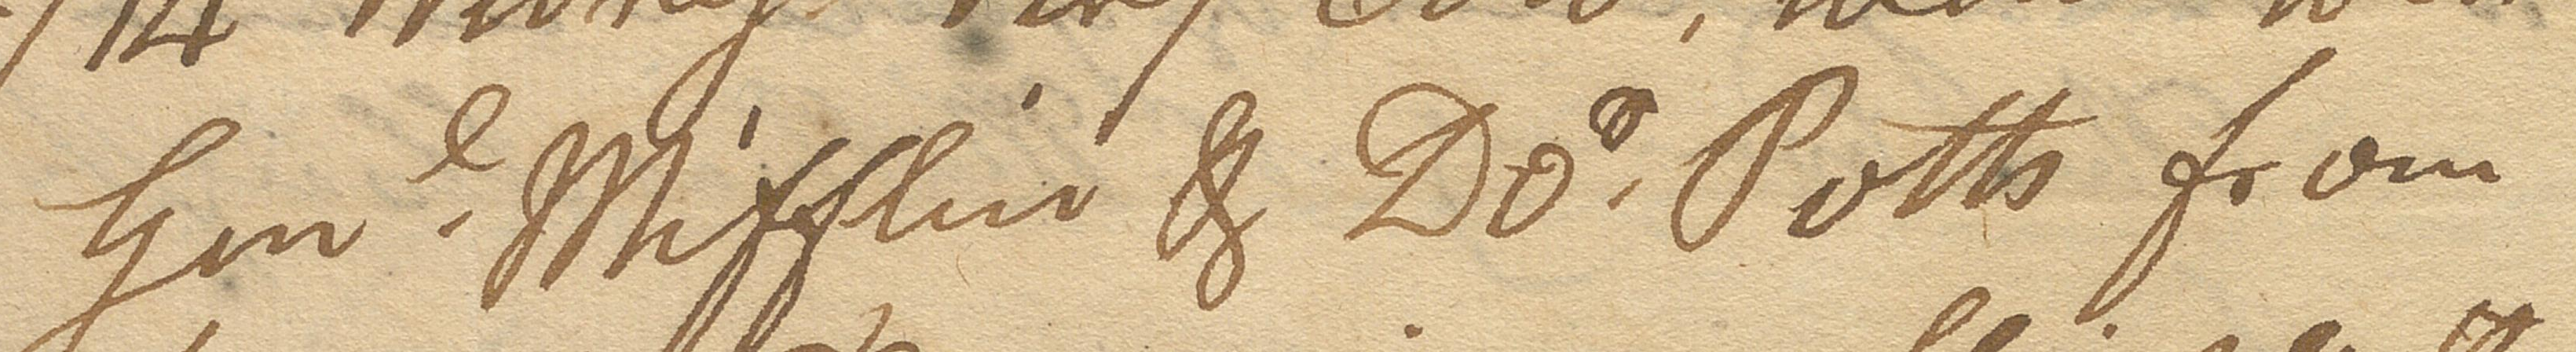Gen^l Mifflin & Do^r. Potts from
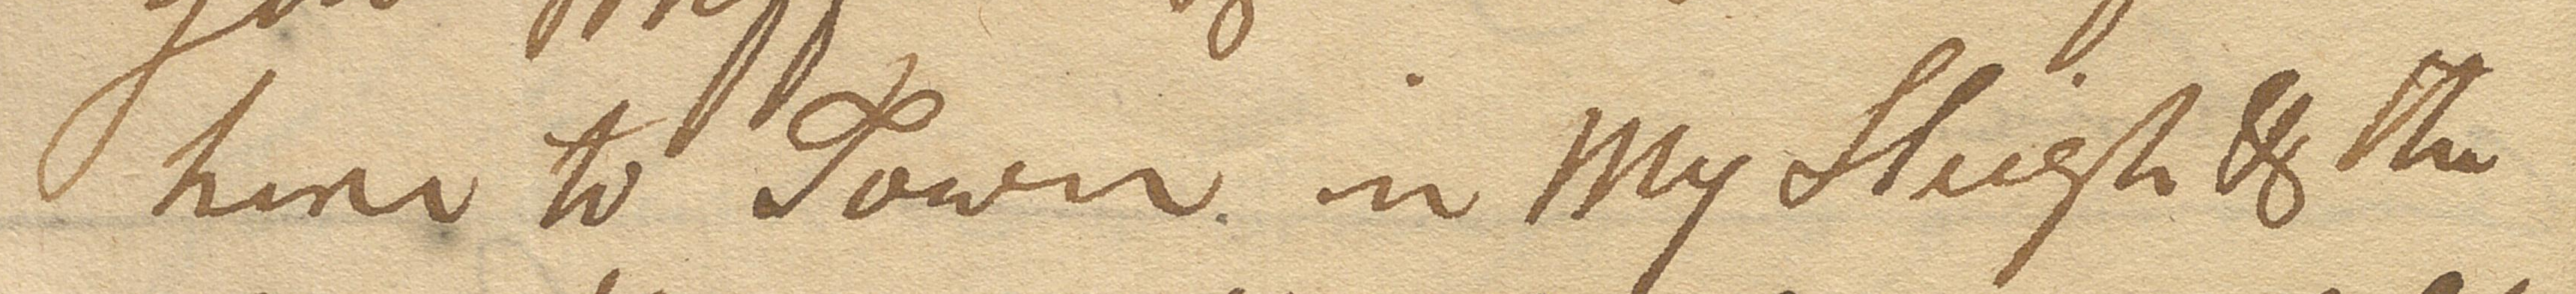here to Town in My Sleigh & the
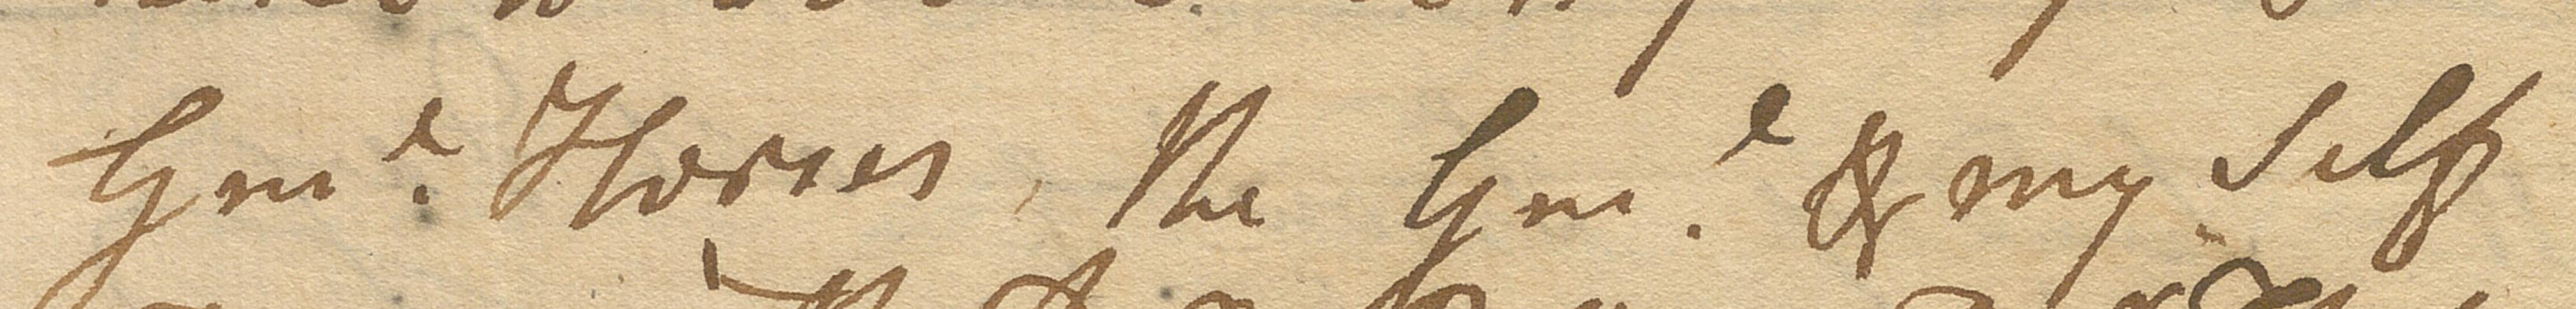Gen^l. Horses, the Gen^l. & my self
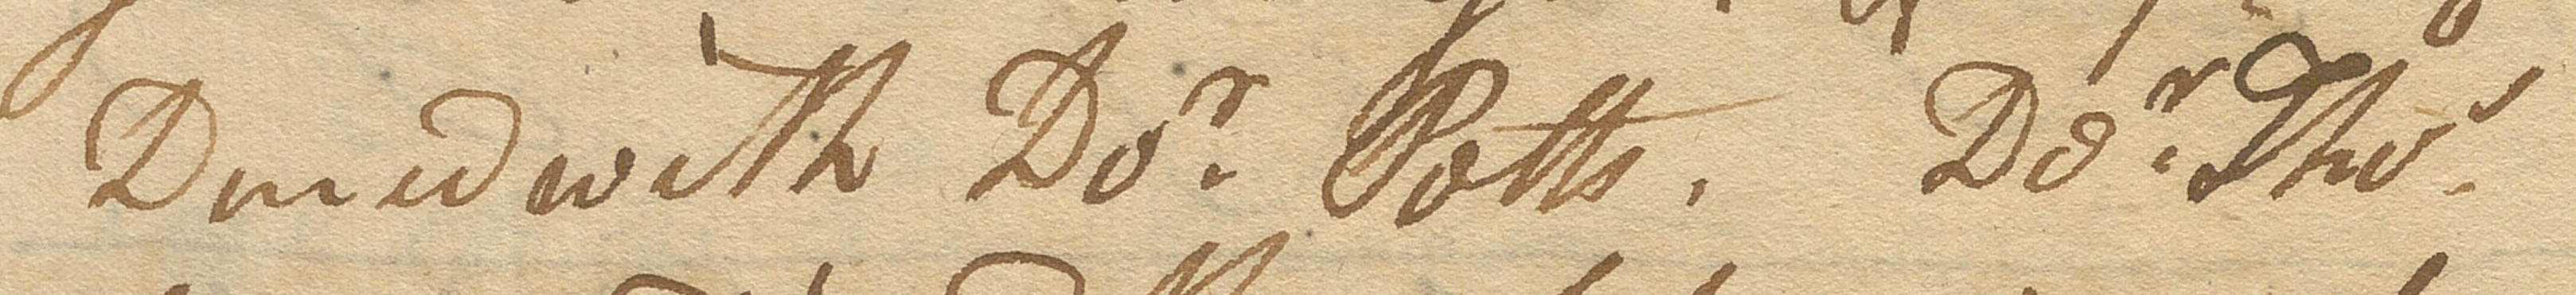Dined with Do^r. Potts. Do^r. Tho^s.
